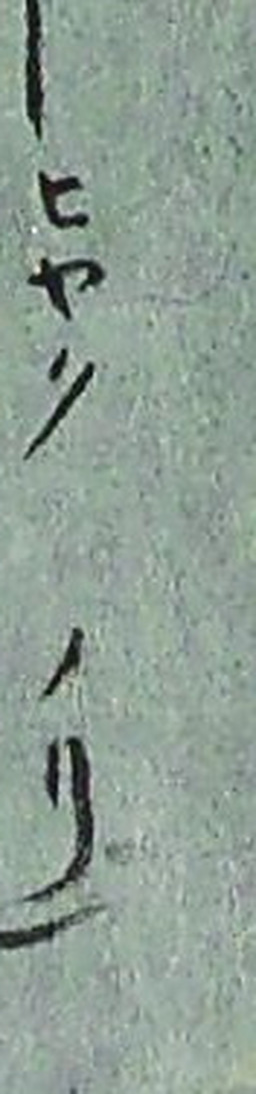ヒヤクノリ
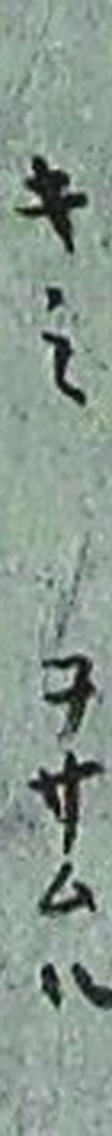キミヲサムル
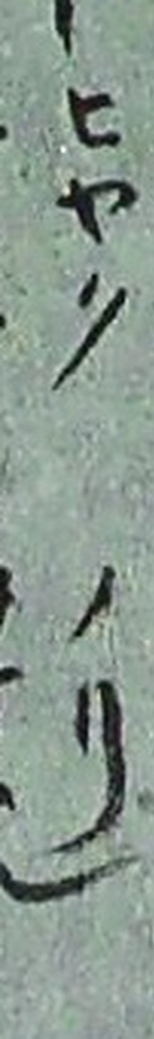ヒヤクノリ
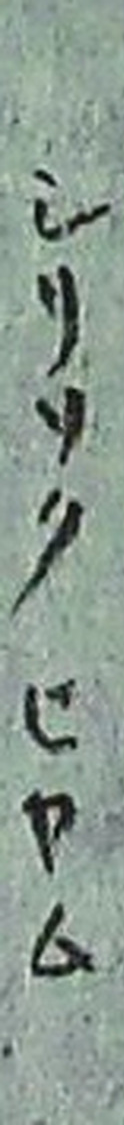シリソクヒヤム
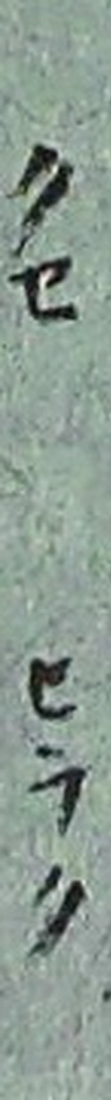クセヒラク
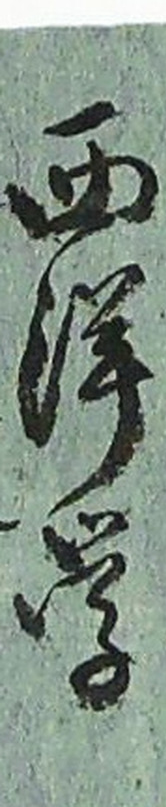西洋学
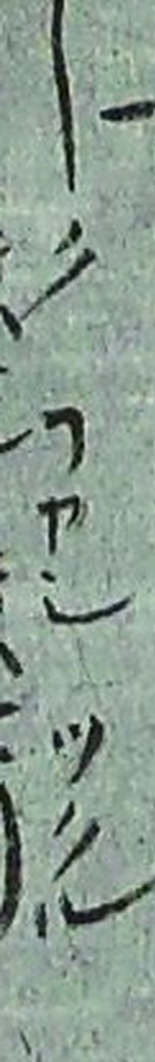クフカシツクル
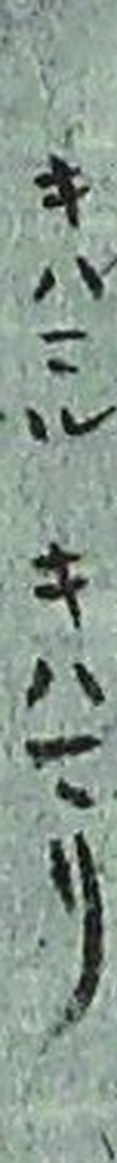キハマルキハマリ
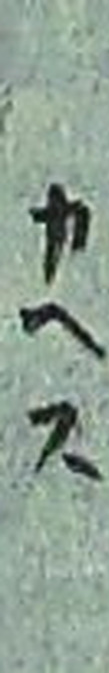カヘス
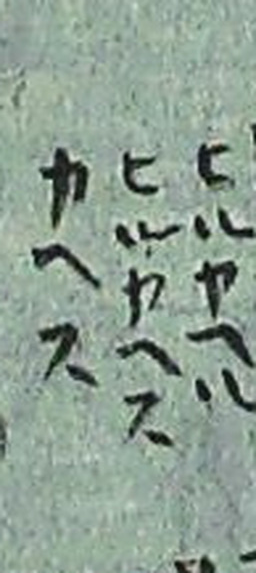カヘス

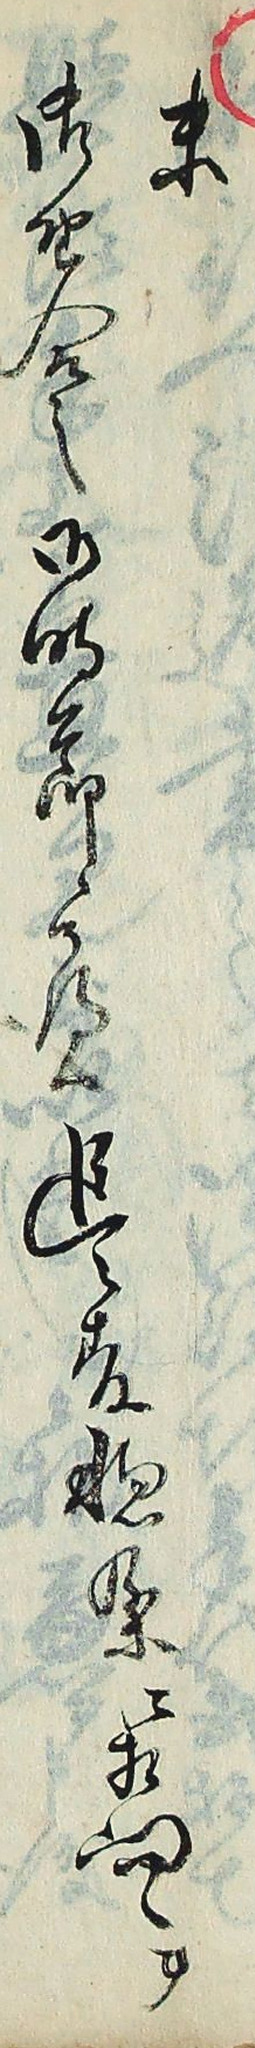御野合之御時節ニ候得ハ追々麦穂条ニ相向候ヲ
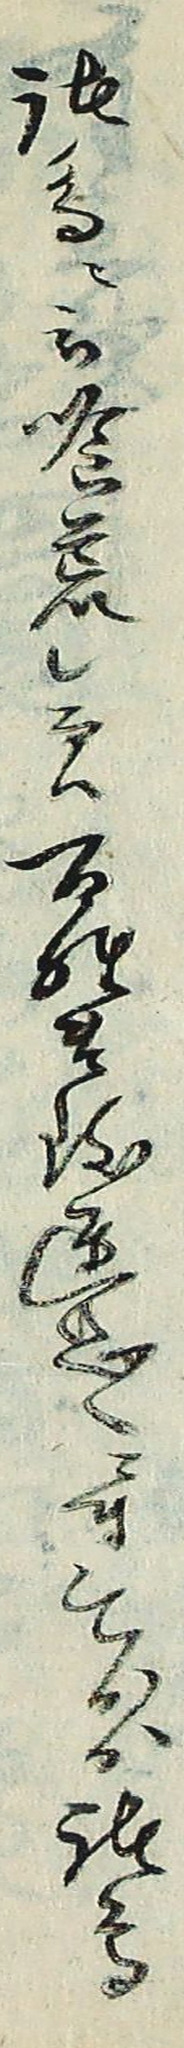諸鳥ニ被喰荒候而ハ百姓共致迷惑候ニ付今日ゟ諸鳥
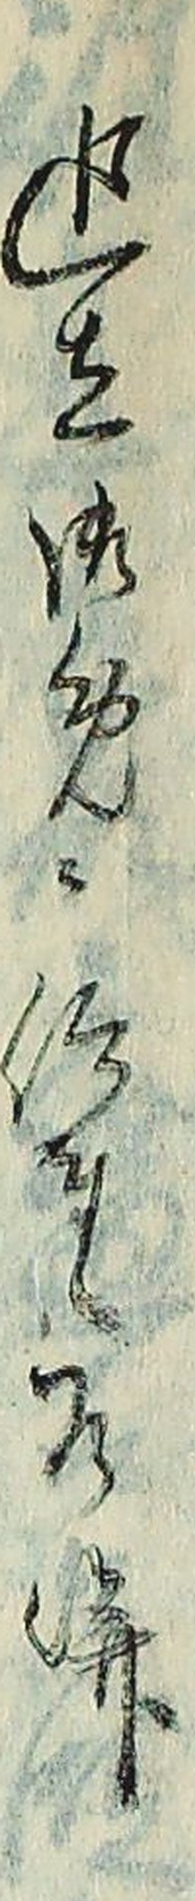追立御免被仰付候乍併
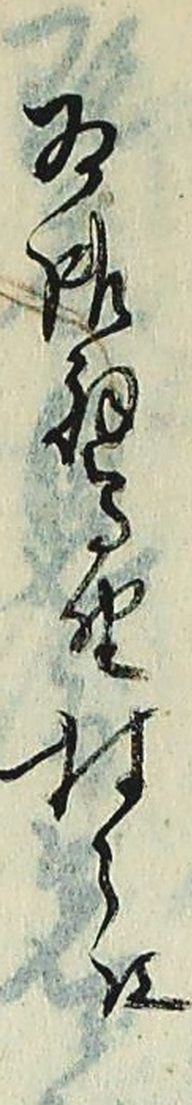為御鷹野村々江
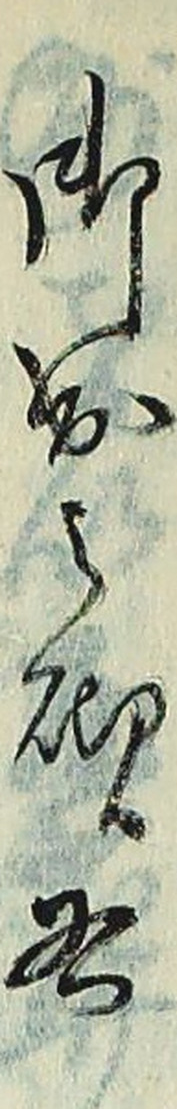御出之砌ハ右
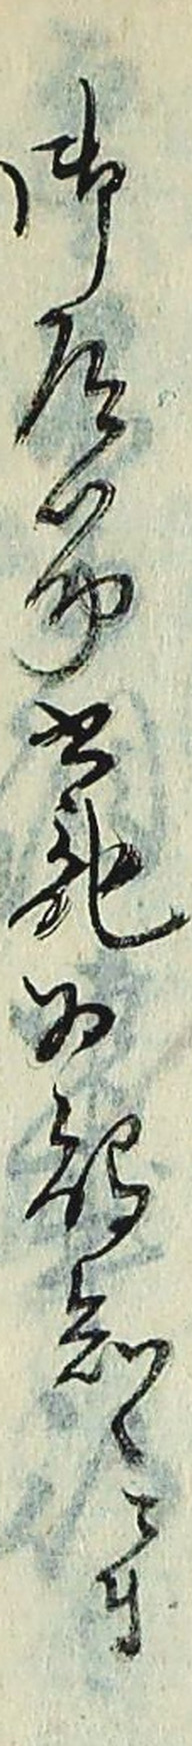御道筋書記為触知候ニ付
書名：諸御趣意書并御下知向之写
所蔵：鳴門教育大学 Naruto University of Education
